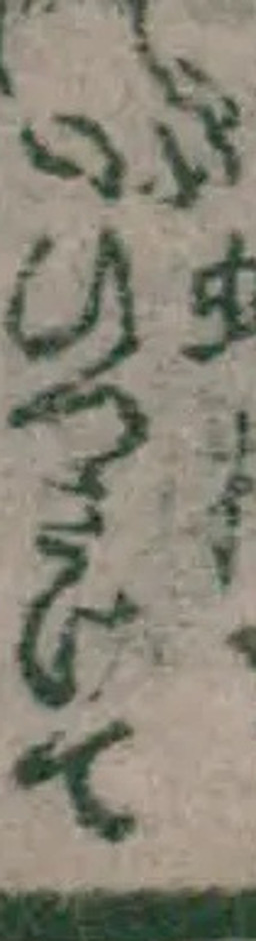ひつさけて
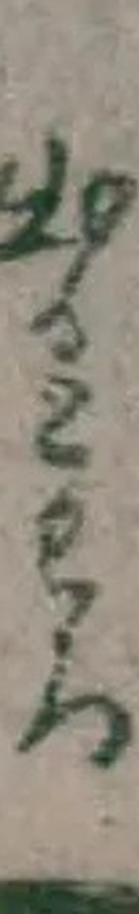出るところ
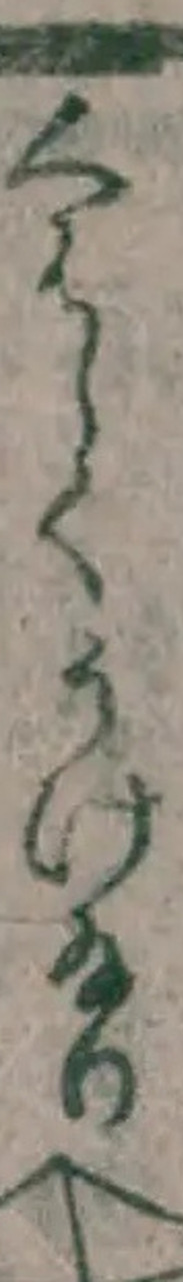くはしくうけ給り
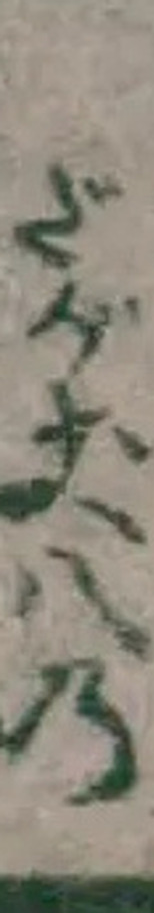だが丈八の
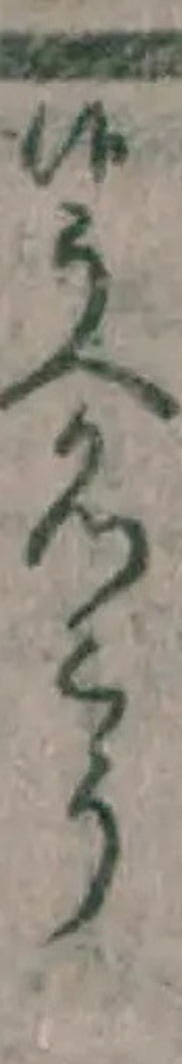候うへかつこう
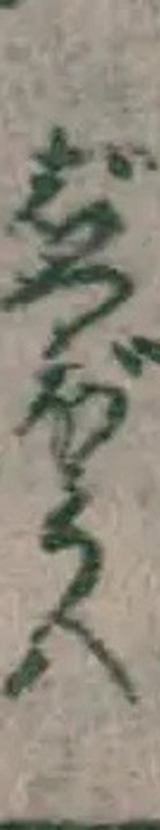じつぼうは
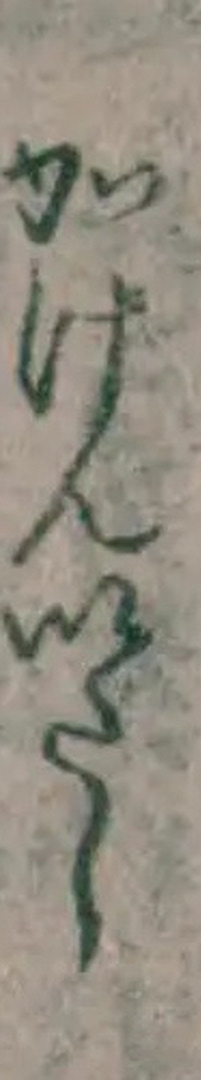かけんいたし
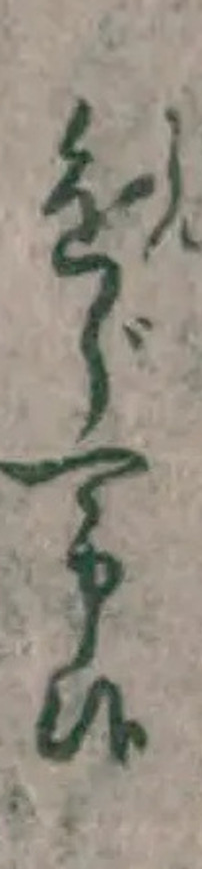進じ可申候
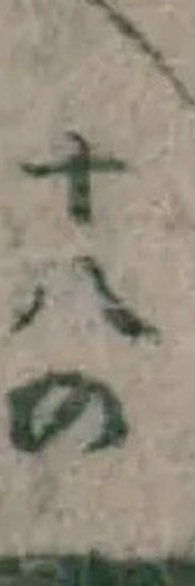十八の
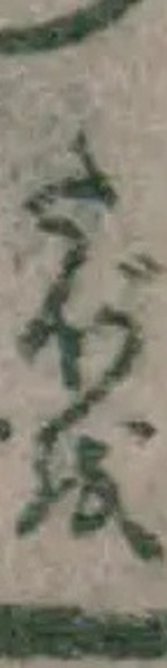たぼを
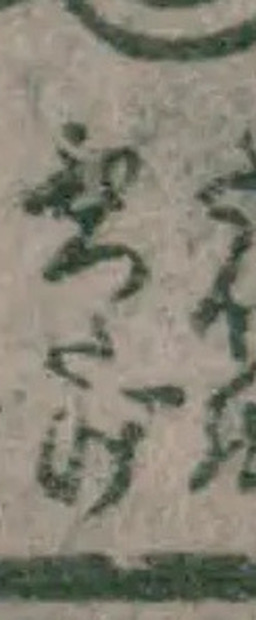ひつさげ
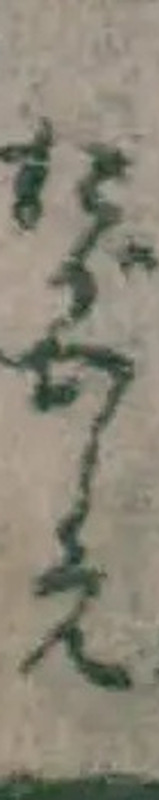たがおしえ
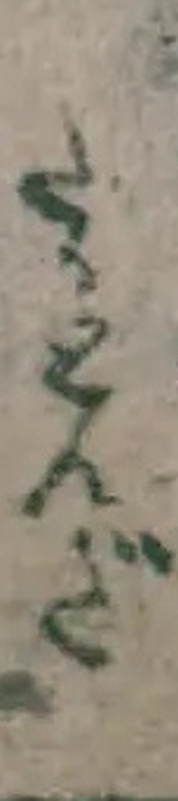たかとんだ
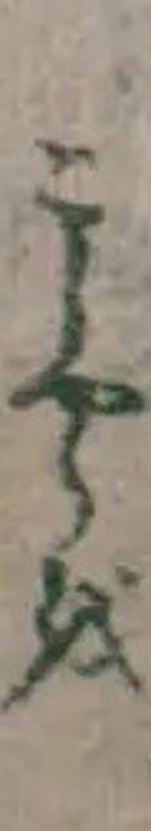こしやくを
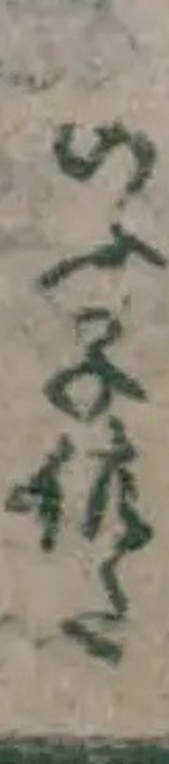いふ子供た

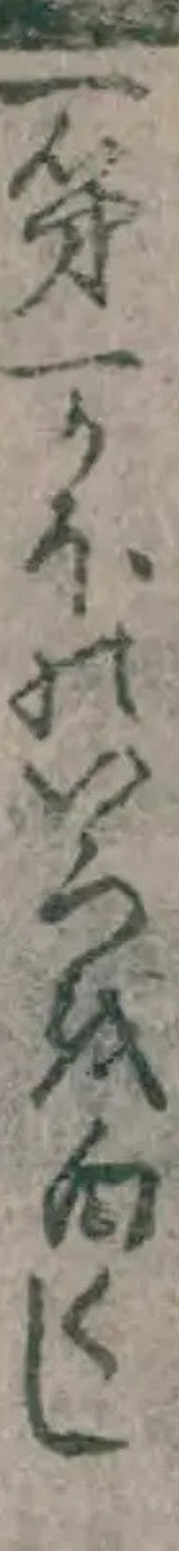一第一かほのいろを白くし
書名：視薬霞報条 3巻
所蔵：国立国会図書館 National Diet Library, JAPAN
